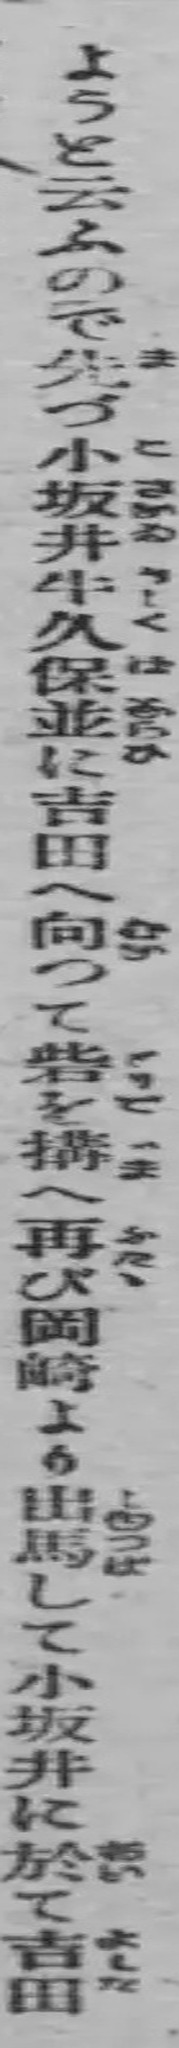ようと云ふので先づ小坂井牛久保並に吉田へ向つて砦を搆へ再び岡崎より出馬して小坂井に於て吉田
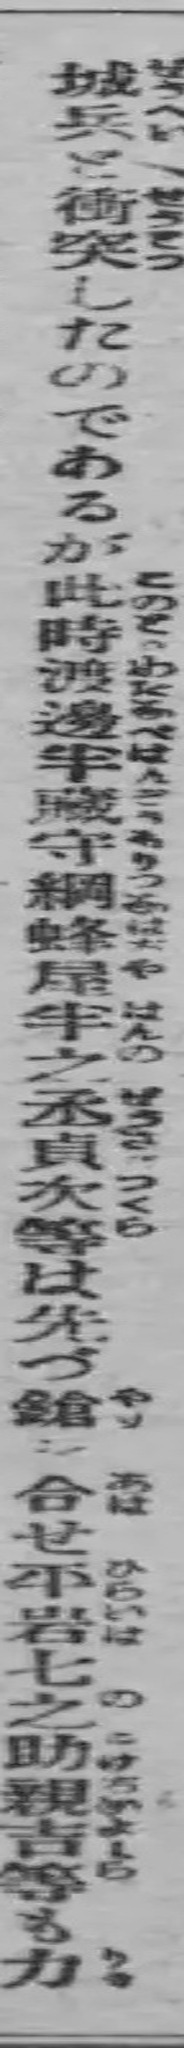城兵と衝突したのであるが此時渡邊半蔵守綱蜂屋半之亟貞次等は先づ鎗を合せ平岩七之助親吉等も力
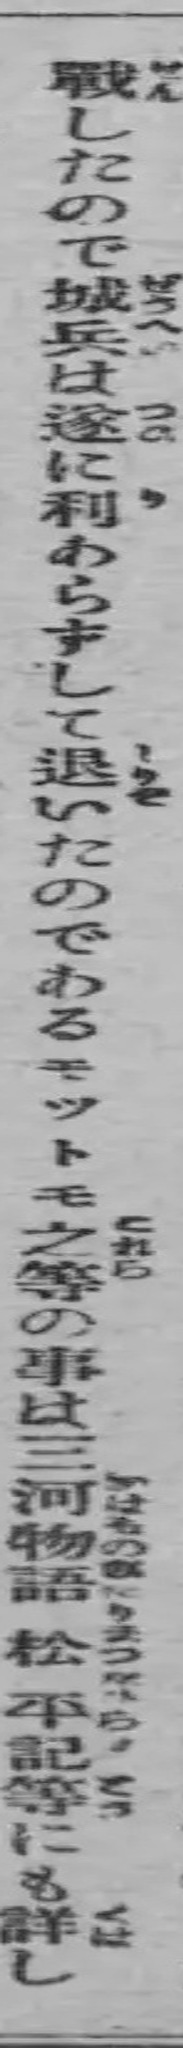戦したので城兵は遂に利あらずして退いたのであるモツトモ之等の事は三河物語松平記等にも詳し
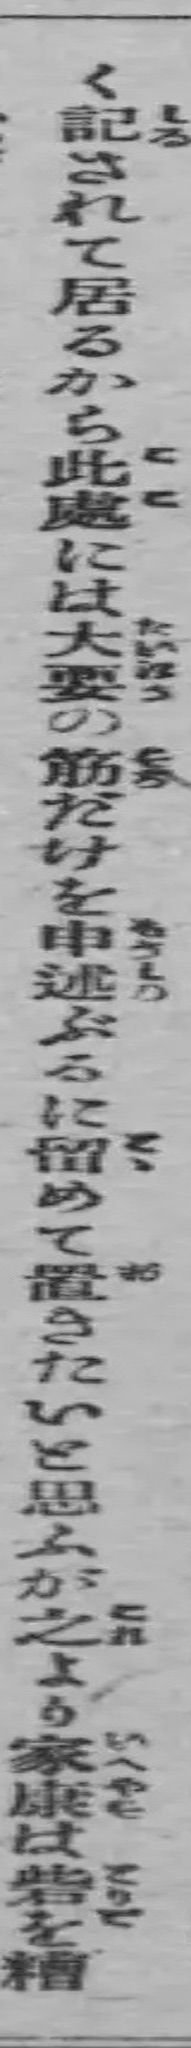く記されて居るから此処には大要の筋だけを申述ぶるに留めておきたい置きたいと思ふが之より家康は砦を糟
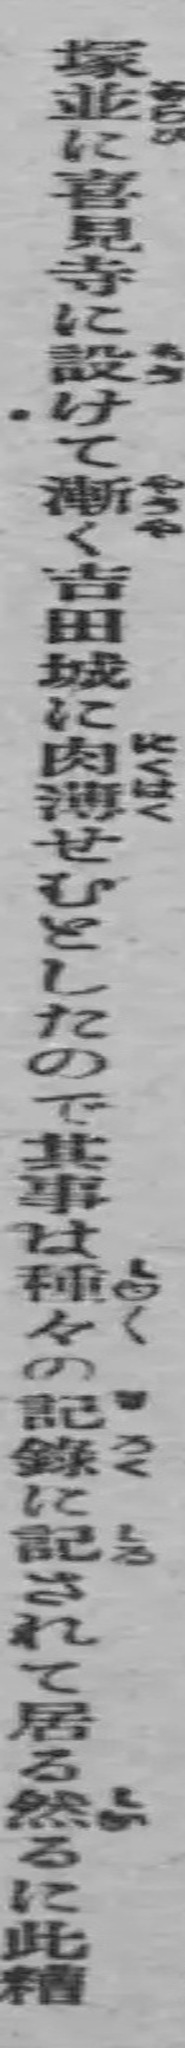塚並に喜見寺に設けて漸く吉田城に肉薄せむとしたので其事は種々の記録に記されて居る然るに此糟
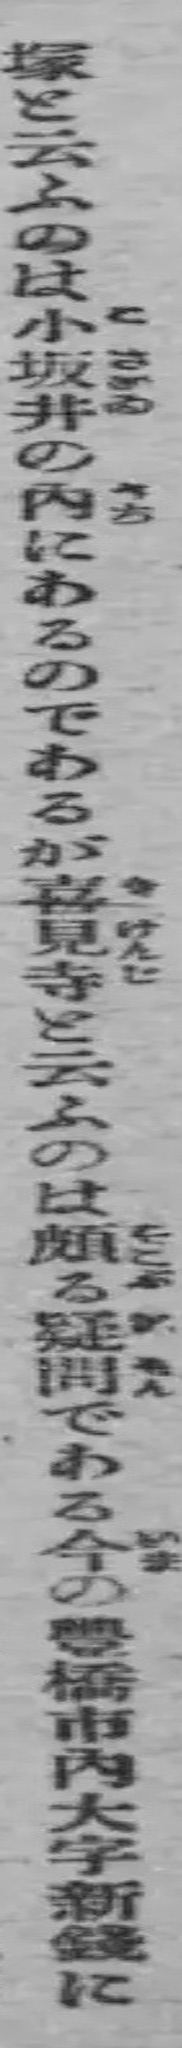糟塚塚と云ふのは小坂井の内にあるのであるが喜見寺と云ふのは頗る疑問である今の豊橋市内大字新銭に
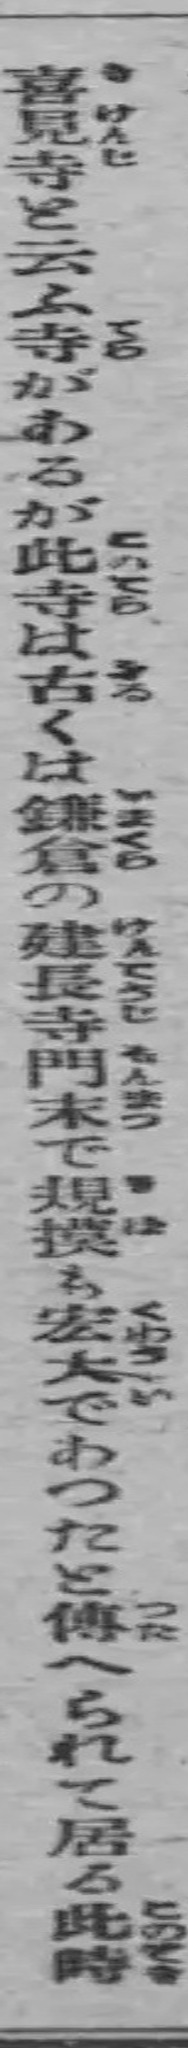喜見寺喜見寺と云ふ寺があるが此寺は古くは鎌倉の建長寺門末で規摸も宏大であつたと伝へられて居る此時
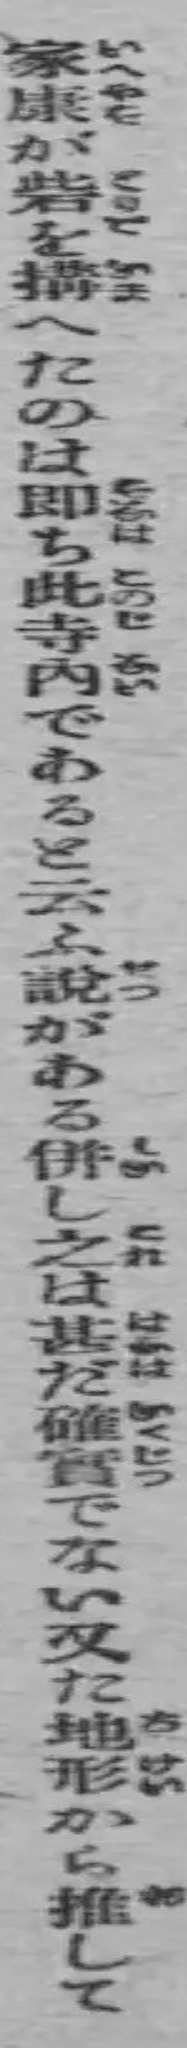家康が砦を搆へたのは即ち此寺内であると云ふ説がある併し之は甚だ確実でない又た地形から推して
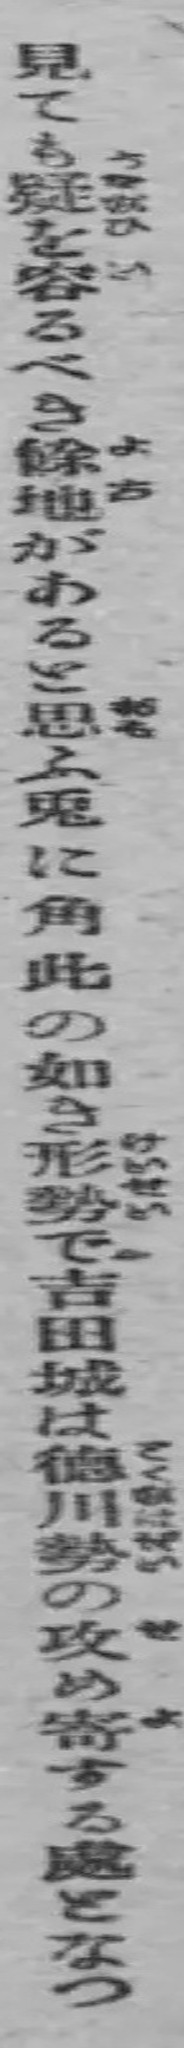見ても疑を容るべき余地があると思ふ兎に角此の如き形勢で吉田城は徳川勢の攻め寄する処となつ
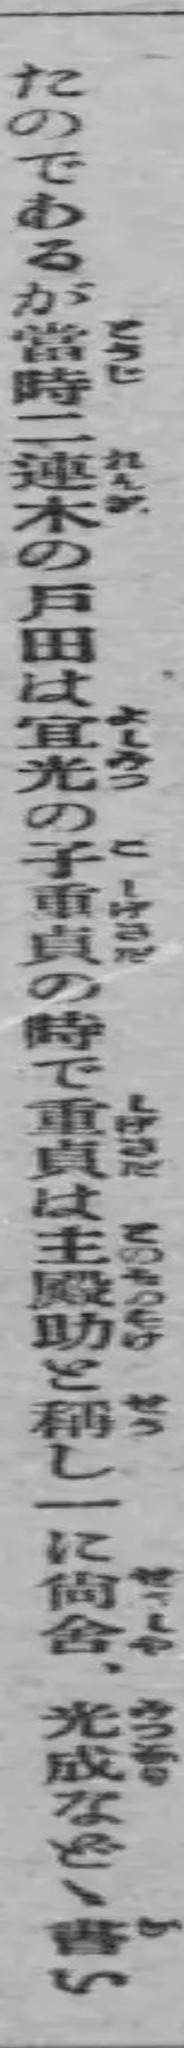たのであるが当時二連木の戸田は宜光の子重貞の時で重貞は主殿助と称し一に尚舎、光成などゝ書い
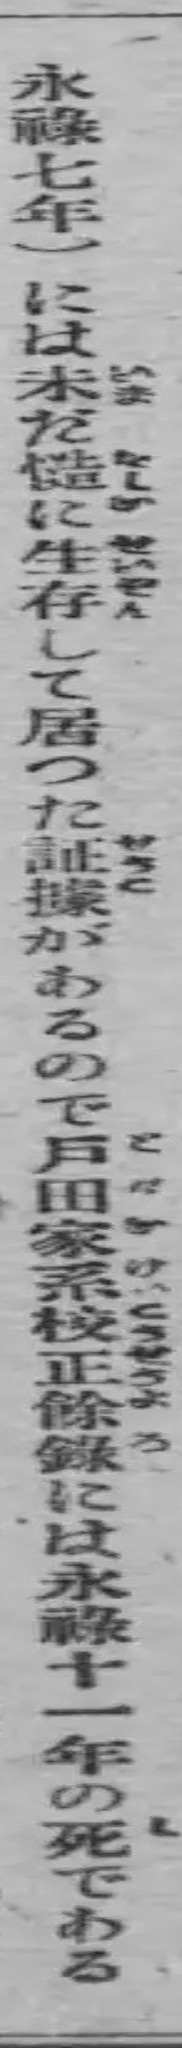永禄七年)には未だ慥に生存して居つた証拠があるので戸田家系校正余録には永禄十一年の死である
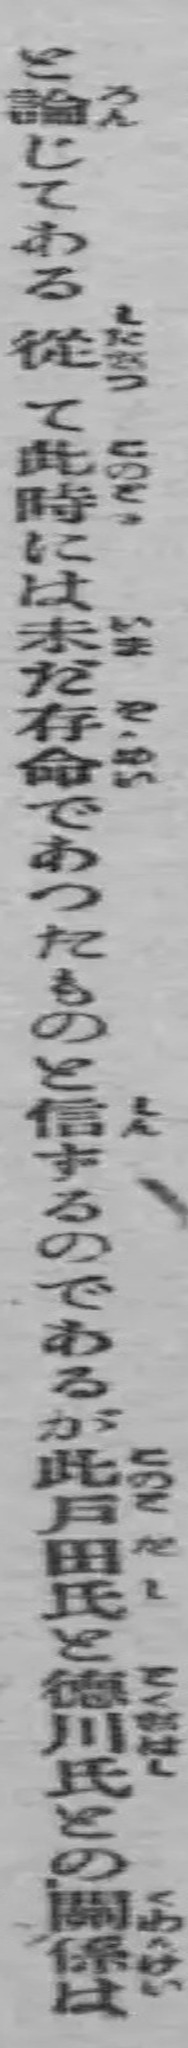と論じてある従て此時には未だ存命であつたものと信ずるのであるが此戸田氏と徳川氏との関係は
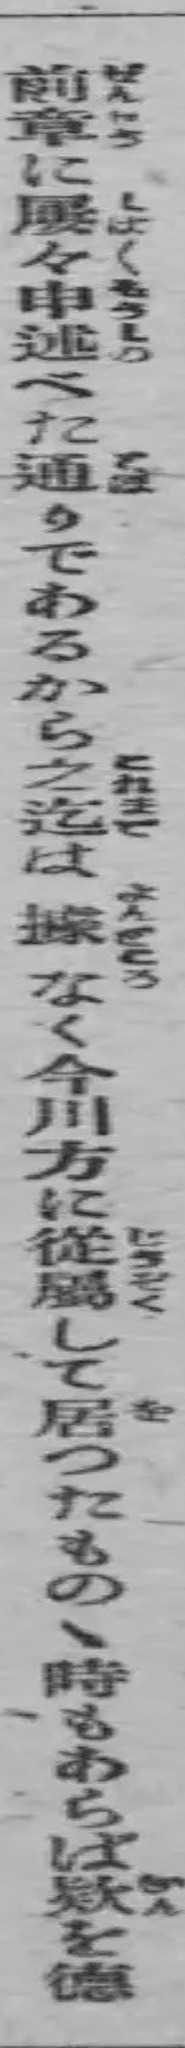前章に屡々申述べた通りであるから之迄は拠なく今川方に従属して居つたものゝ時もあらば欵を徳
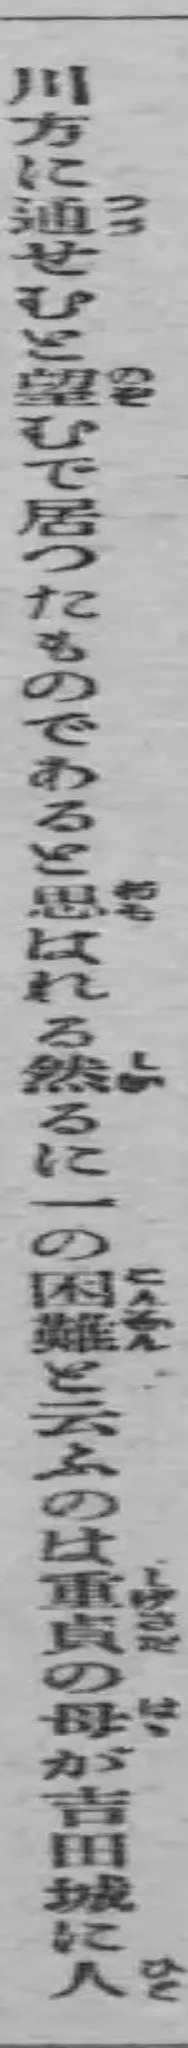川方に通せむと望むで居つたものであると思はれる然るに一の困難と云ふのは重貞の母が吉田城に人
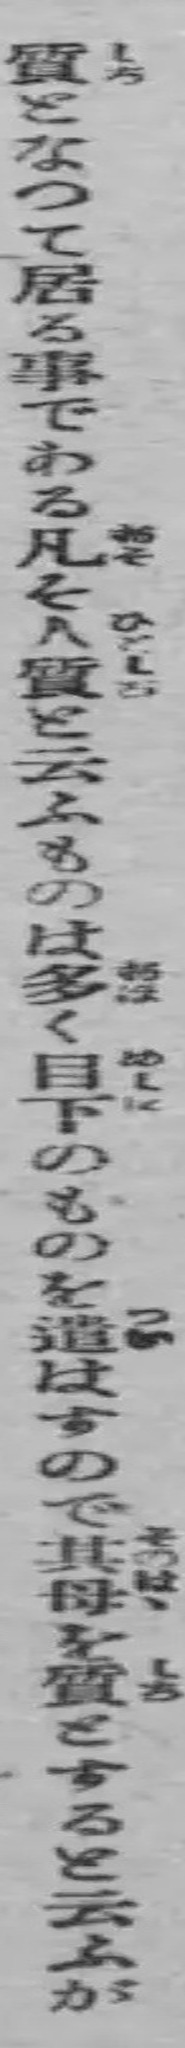質となつて居る事である凡そ人質と云ふものは多く目下のものを遣はすので其母を質とすると云ふが
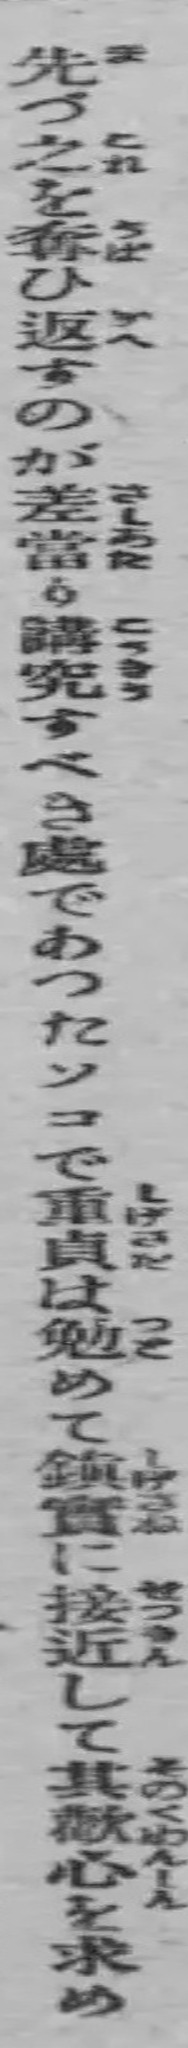先づ之を奪ひ返すのが差当り講究すべき処であつたソコで重定は勉めて鎮実に接近して其歓心を求め
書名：豊橋市史談
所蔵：国立国会図書館 National Diet Library, JAPAN
